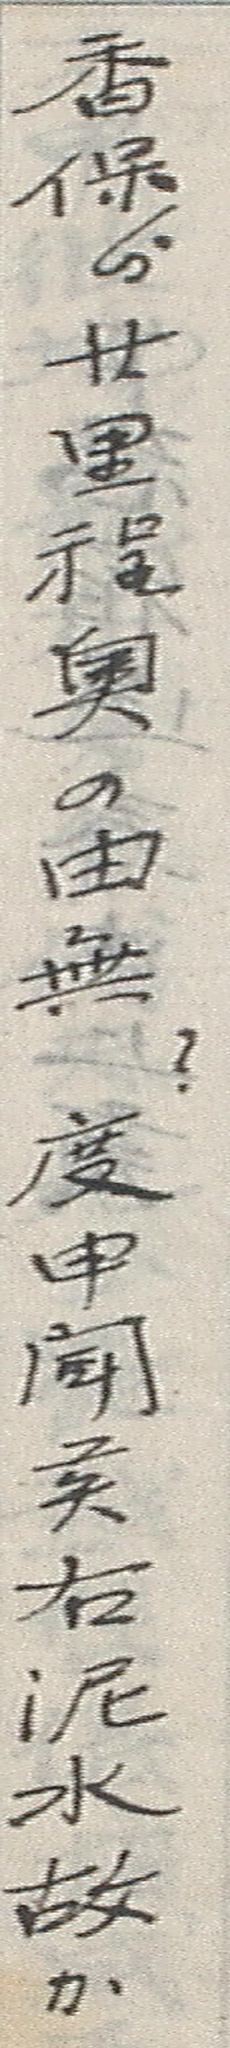香保より廿里程奥の由無？度申聞候右泥水故か
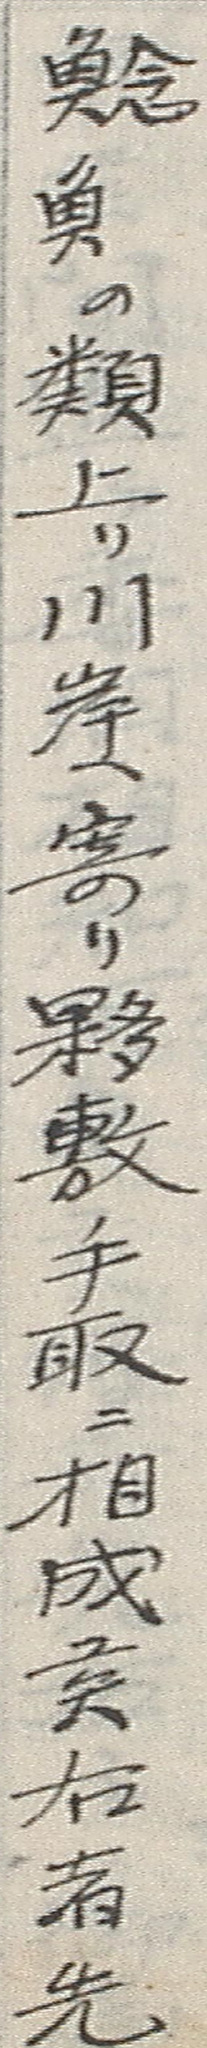鯰魚？の類上り川岸へ寄り夥敷手取相成候右者先
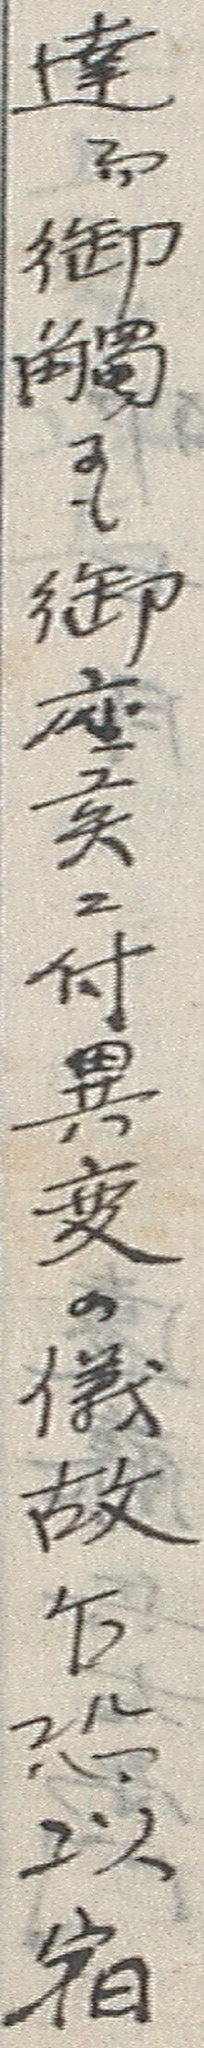達而御觸にも御座候ニ付異変の儀故乍恐以宿
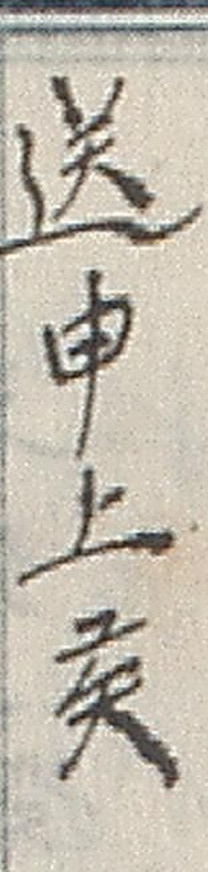送申上候
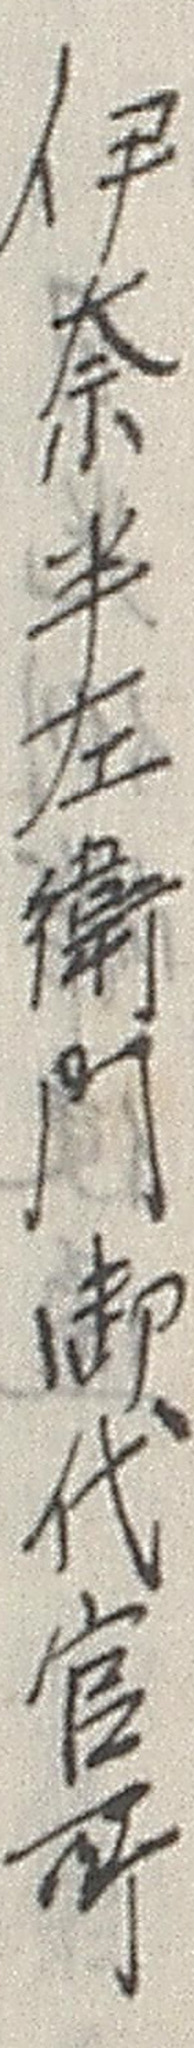伊奈半左衛門御代官所
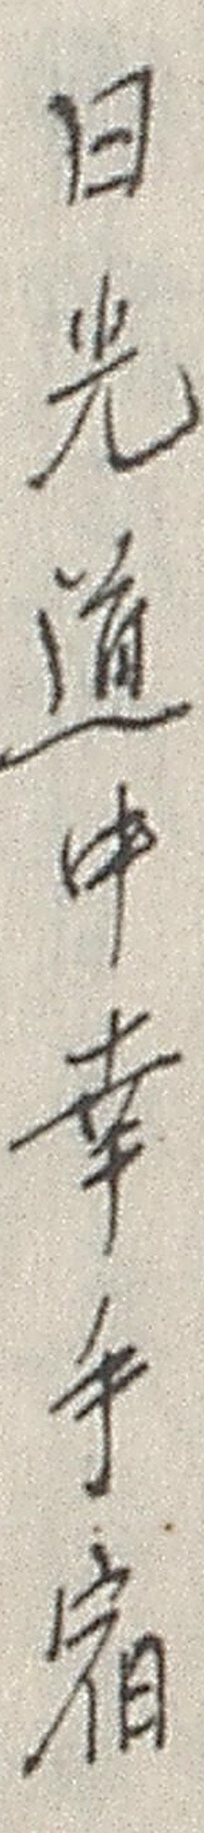日光道中幸手宿
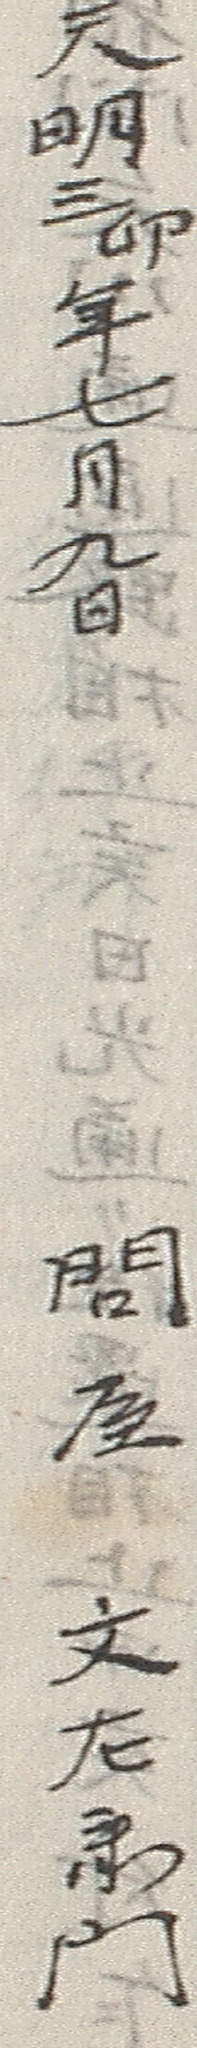天明三卯年七月九日問屋文左衛門
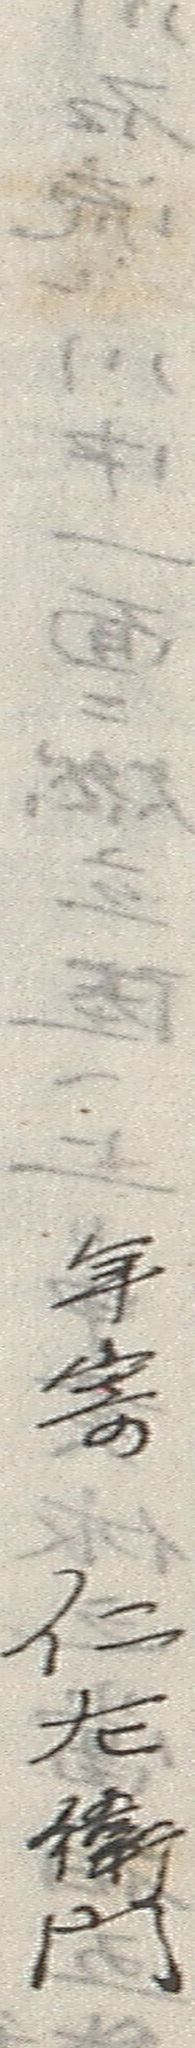年寄仁左衛門
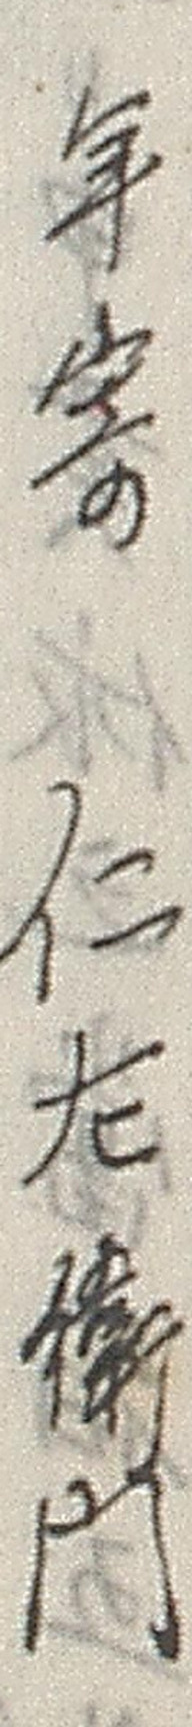年寄仁左衛門
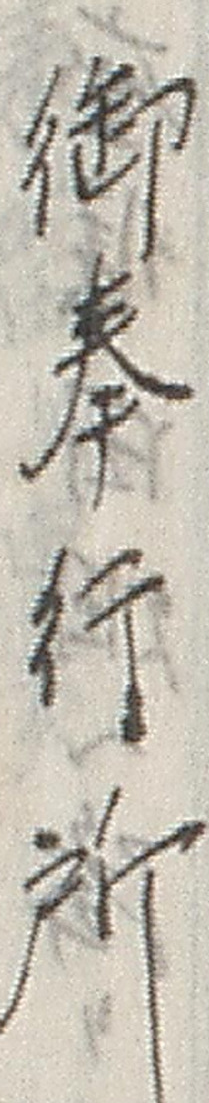御奉行所
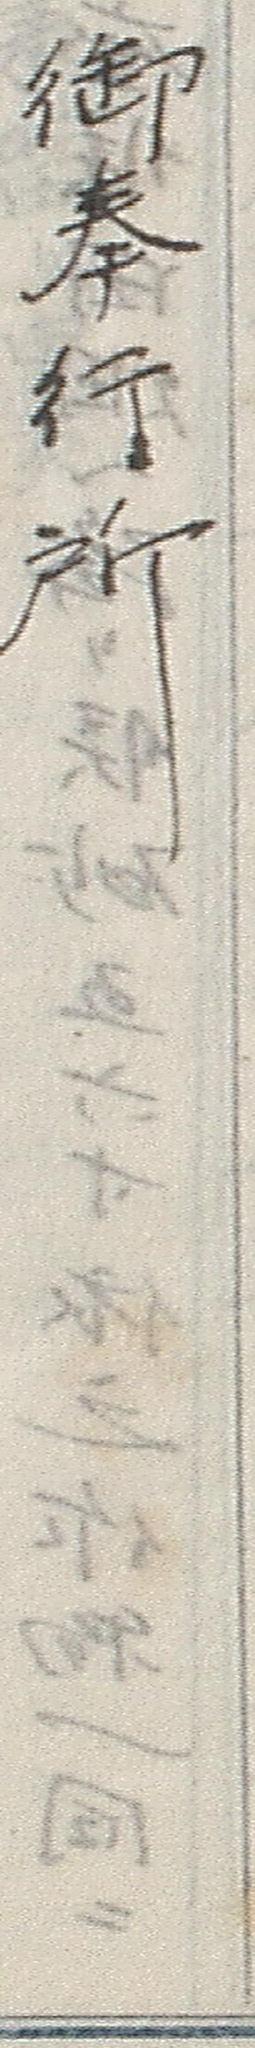御奉行所
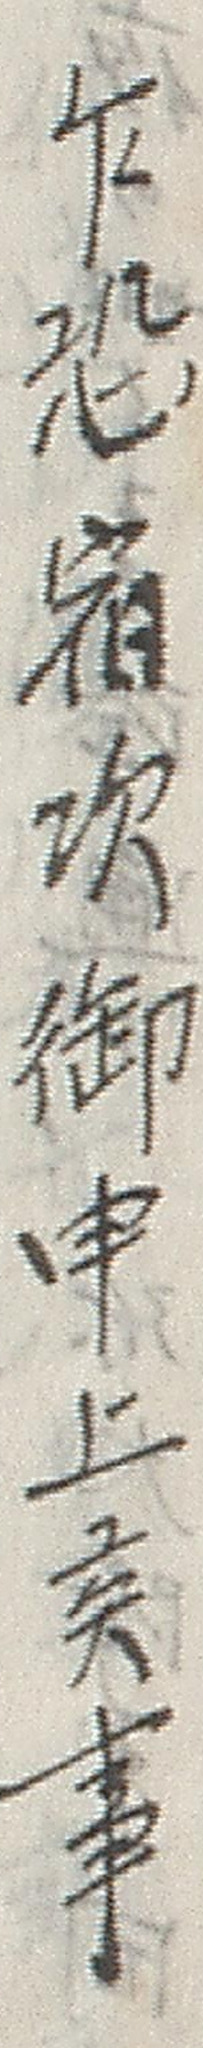乍恐宿次御申上候事
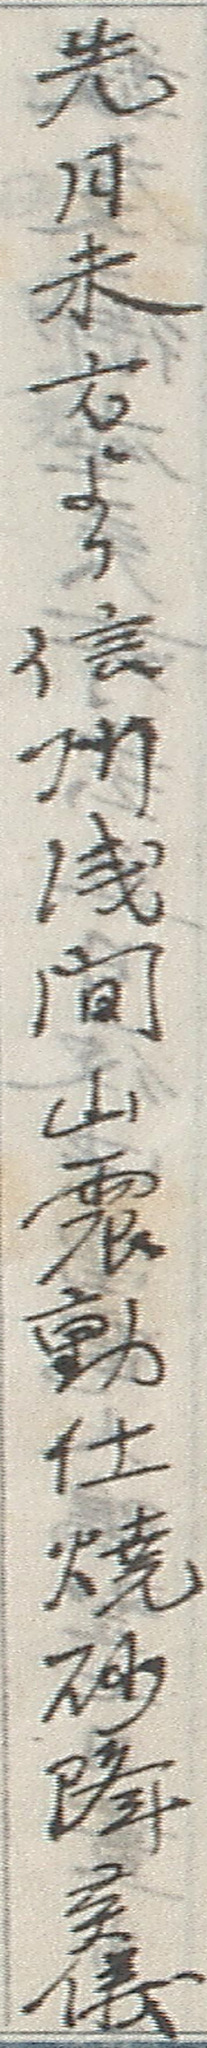先月未方より信州浅間山震動仕焼砂降候儀

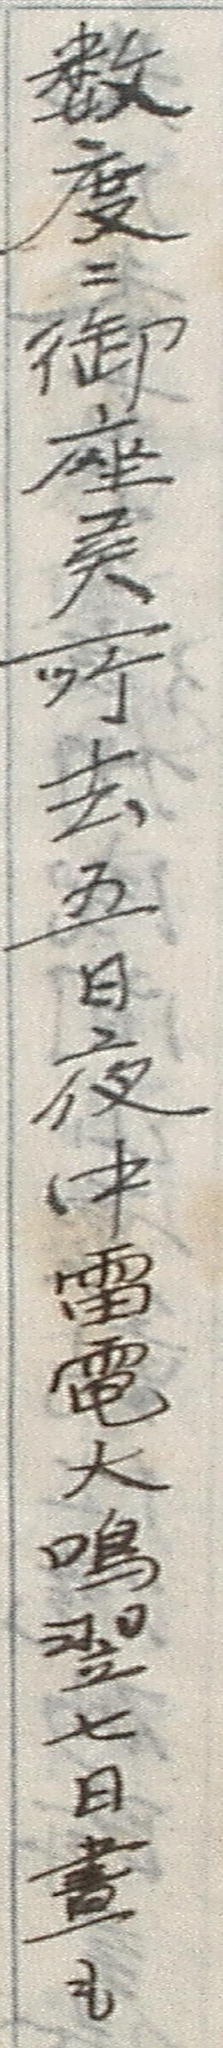数度ニ御座候所去五日夜中雷電大鳴翌七日昼も
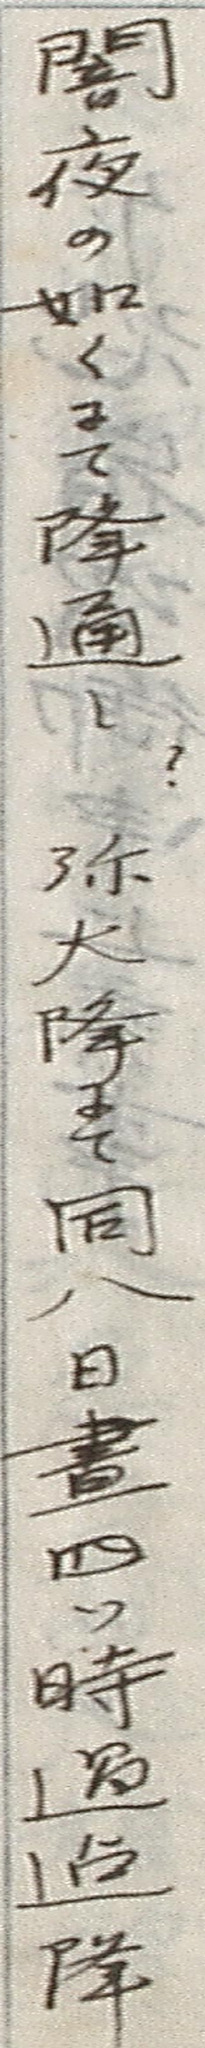闇夜の如くにて降通し？弥大降にて同八日昼四ツ時過迄降
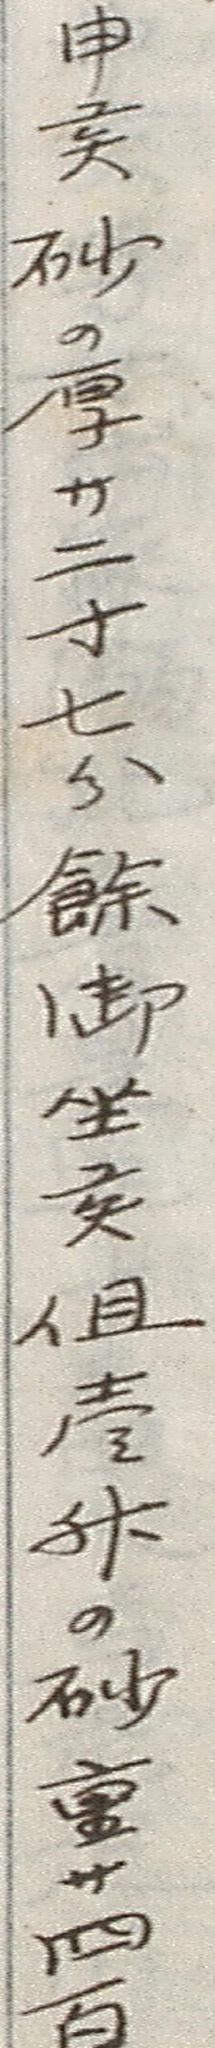申候砂の厚サ二寸七分余御座候但壱升の砂重サ四百
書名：浅間山焼出記
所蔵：東京大学地震研究所図書室 Earthquake Research Institute Library, The University of Tokyo, JAPAN
